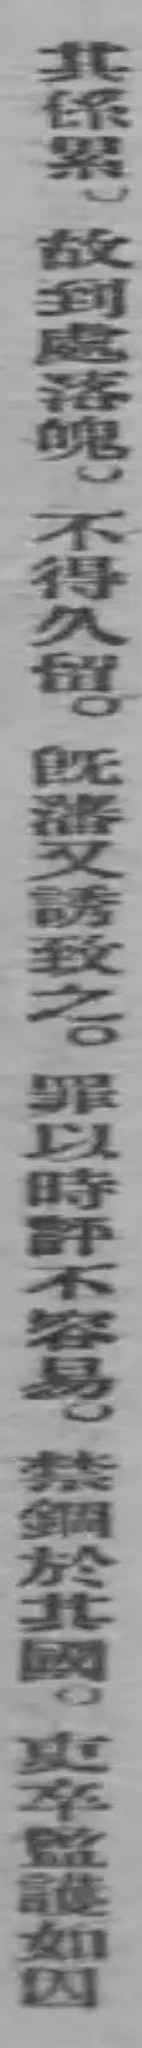其係累。故到処落魄。不得久留。既藩又誘致之。罪以時評不容易。禁錮於其国。吏卒監護如囚

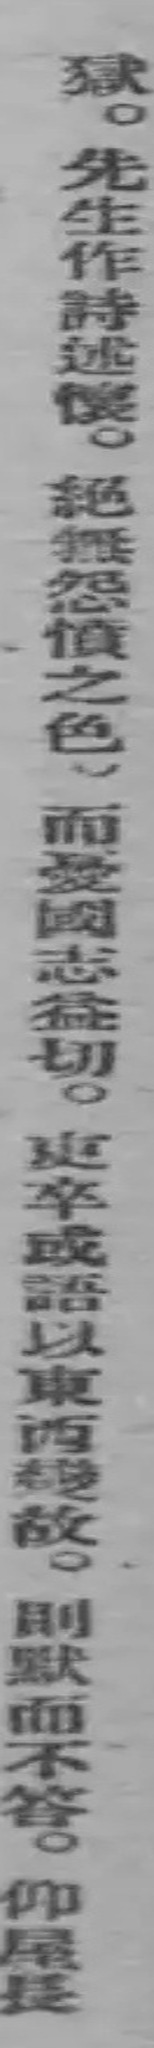獄。先生作詩述懐。絶無怨憤之色。而憂国志益切。吏卒或語以東西変故。則黙而不答。仰屋長
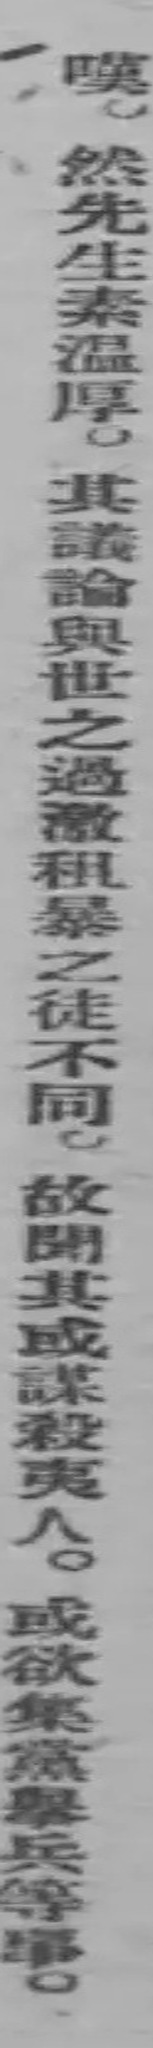嘆。然先生素温厚。其議論與世之過激租暴之徒不同。故聞其或謀殺夷人。或欲集党挙兵等事。
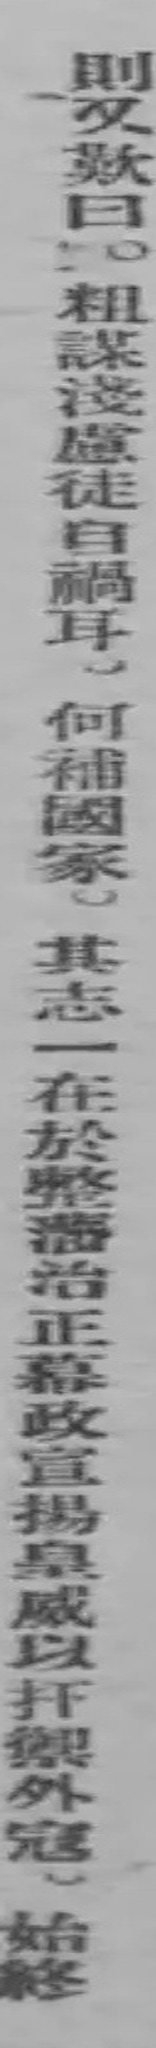則又歎曰。粗謀浅慮徒自禍耳。何補国家。其志一在於整滞治正幕政宣揚皇威扜禦外寇。始終
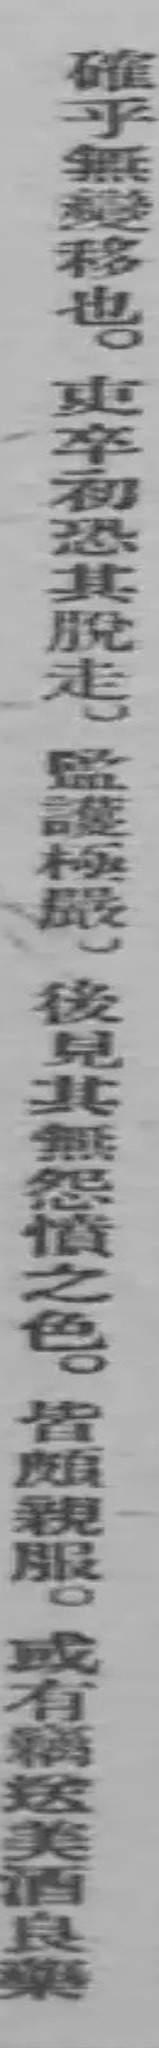確乎無変移也。吏卒初恐其脱走。監護極厳。後見其無怨憤之色。皆頗親服。或有竊送美酒良薬
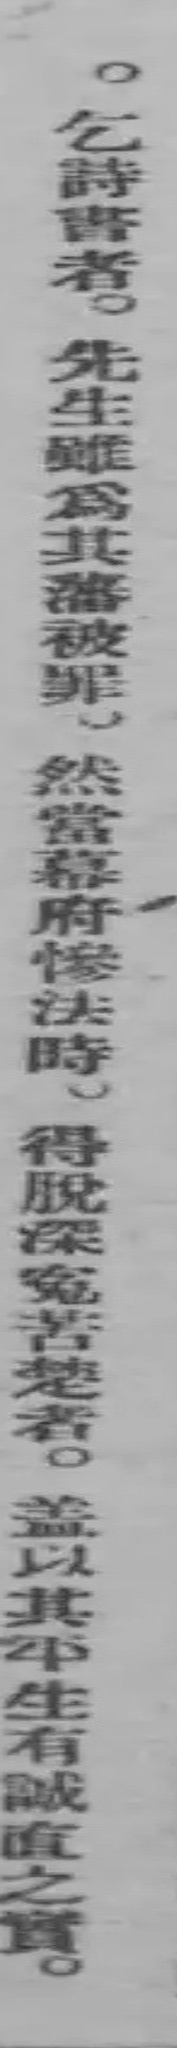。乞詩書者。先生雖為其藩被罪。然当幕府惨法時。得脱深冤苦楚者。盖以其平生有識直之実。
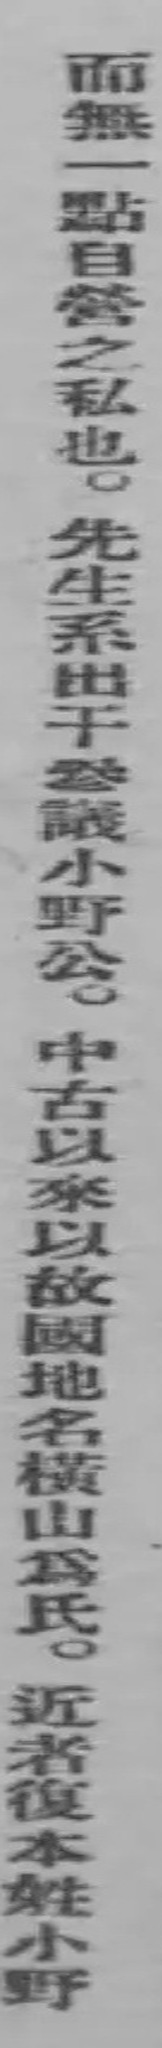而無一点自営之私也。先生系出干参議小野公。中古以来以故国地名横山為氏。近者復本姓小野
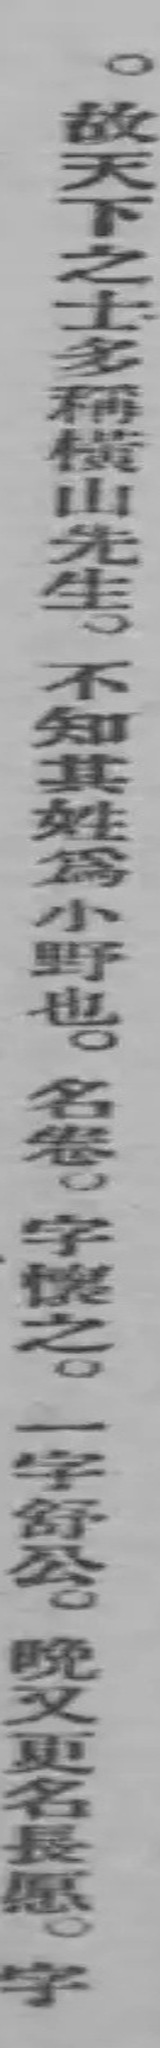。故天下之士多称横山先生。不知其姓為小野也。名巻。字懐之。一字舒公。晩又更名長愿。字
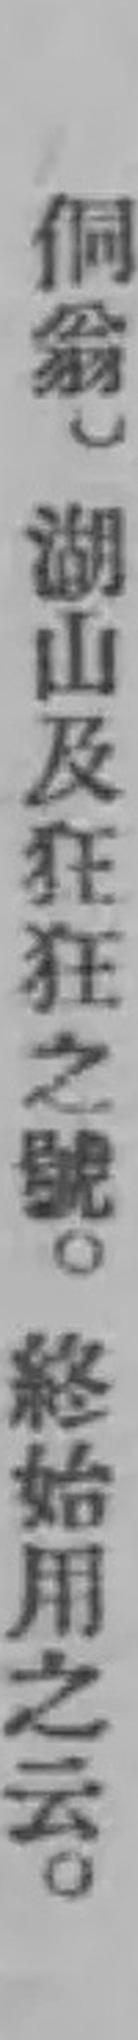侗翁。湖山及狂狂之号。終始用之云。
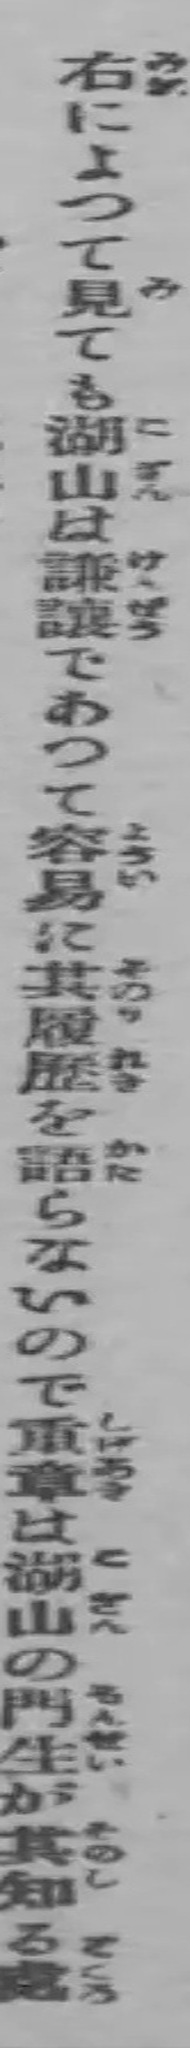右によつて見ても湖山は謙譲であつて容易に其履歴を語らないので重章は湖山の門生が其知る処
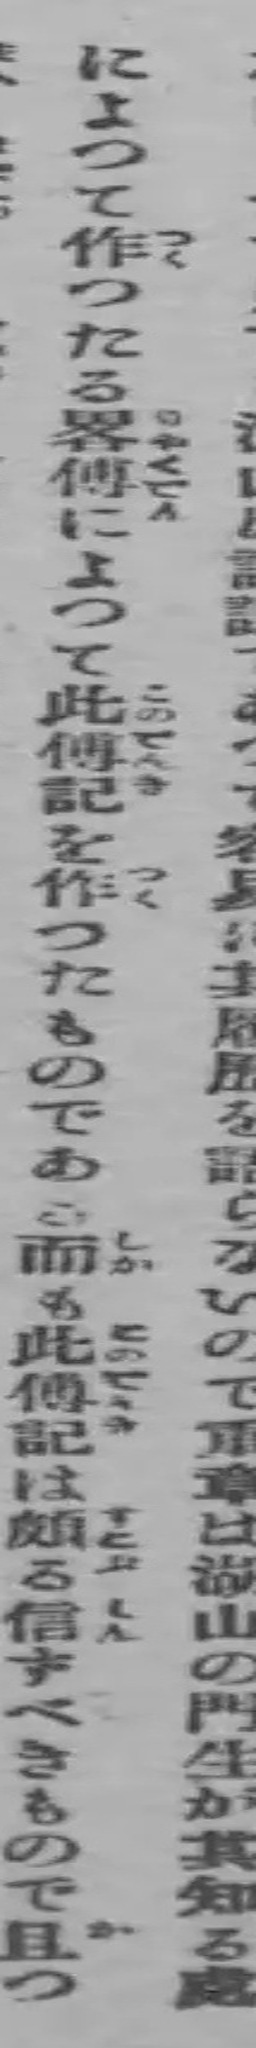によつて作つたる略伝によつて此伝記を作つたものである而も此伝記は頗る信ずべきもので且つ
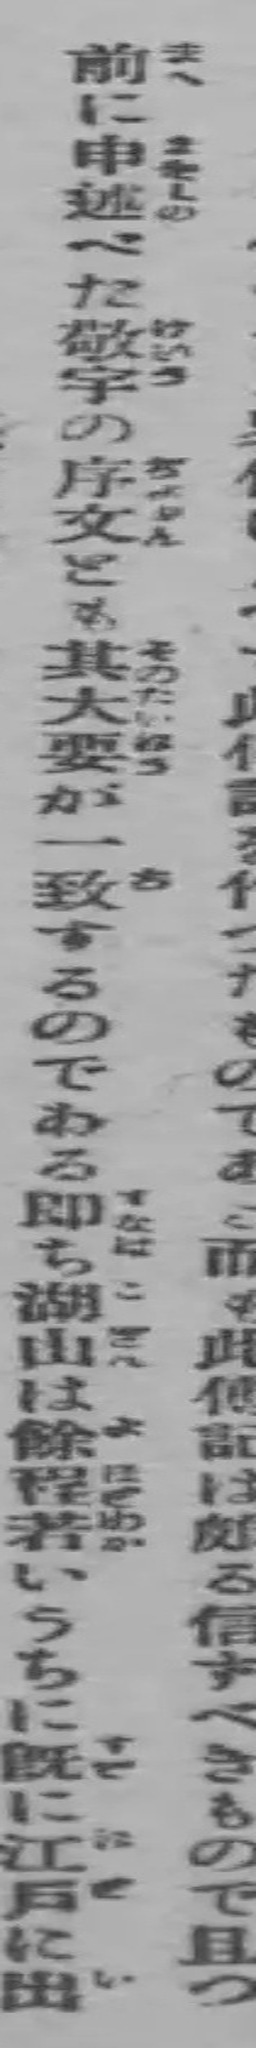前に申述べた敬宇の序文とも其大要が一致するのである即ち湖山は余程若いうちに既に江戸に出
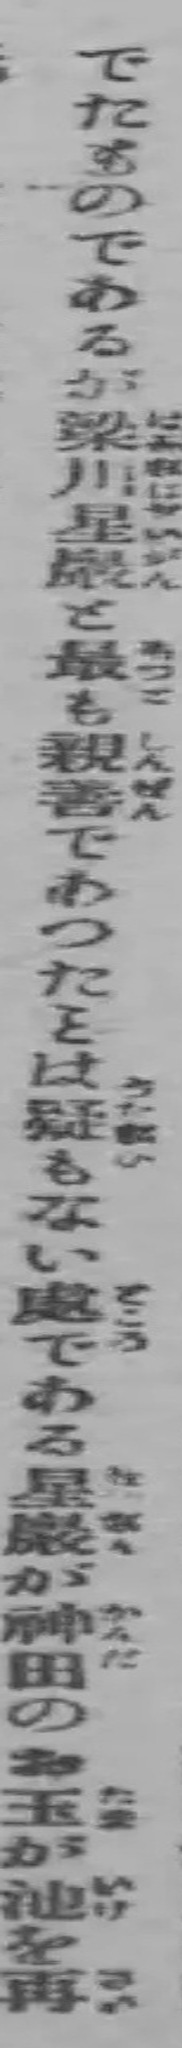でたものであるが梁川星嚴と最も親善であつたことは疑もない処である星嚴が神田のお玉が池を再
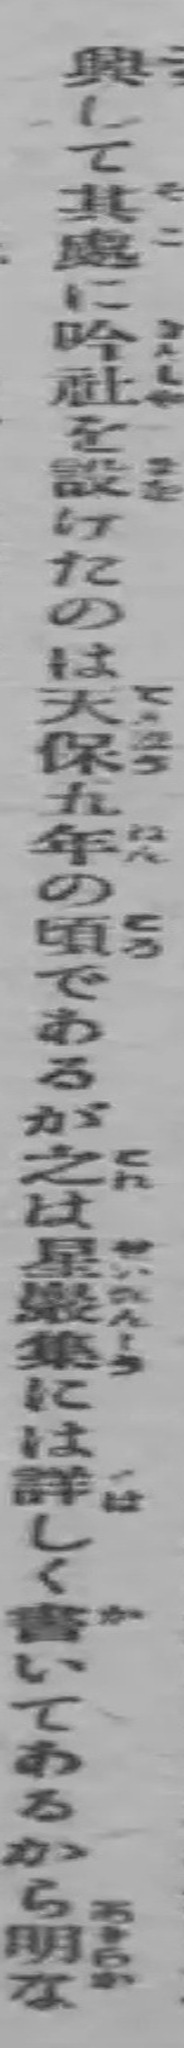興して其処に吟社を設けたのは天保五年の頃であるが之は星嚴集には詳しく書いてあるから明な
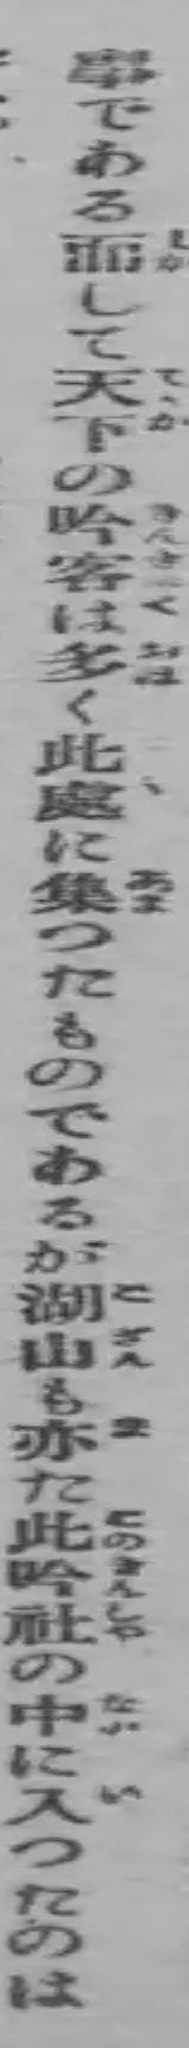事である而して天下の吟客は多く此処に集まつたものであるが湖山も亦た此吟社の中に入つたのは
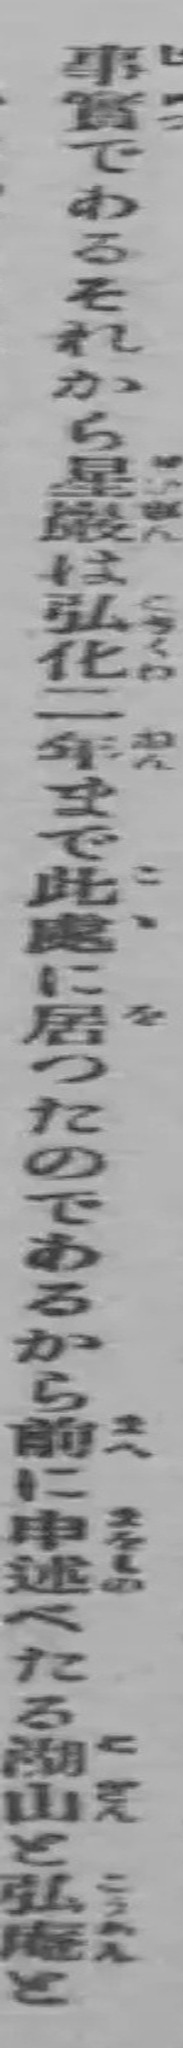事実であるそれから星嚴は弘化二年まで此処に居つたのであるから前に申述べたる湖山と弘庵と
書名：豊橋市史談
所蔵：国立国会図書館 National Diet Library, JAPAN
